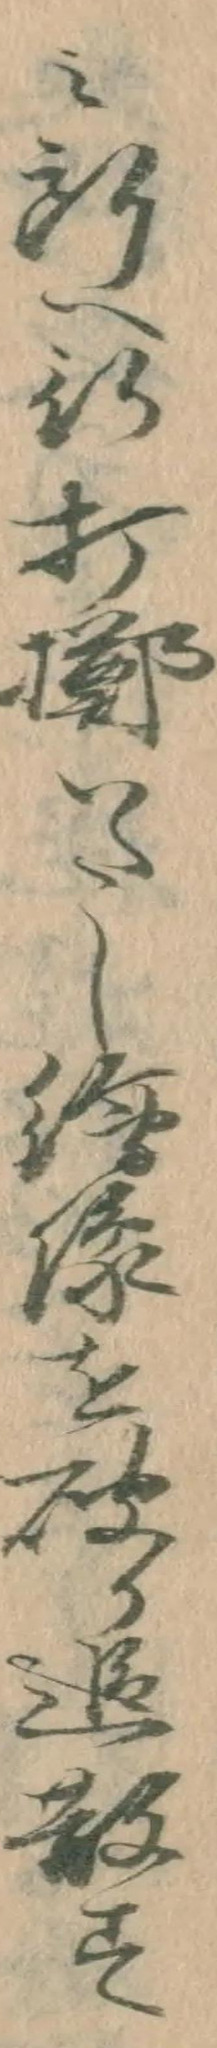之所へ行打擲いたし絵像を破り追散す
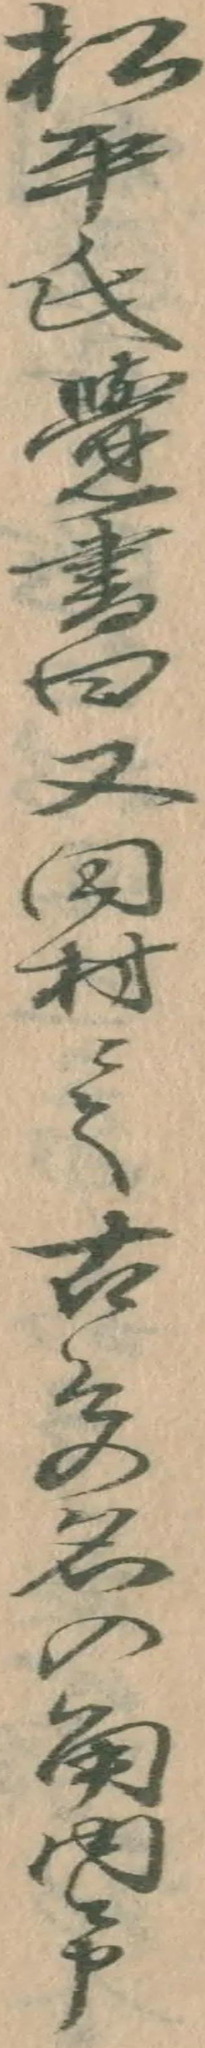松平氏覚書日又同村にて古その名の角内と申
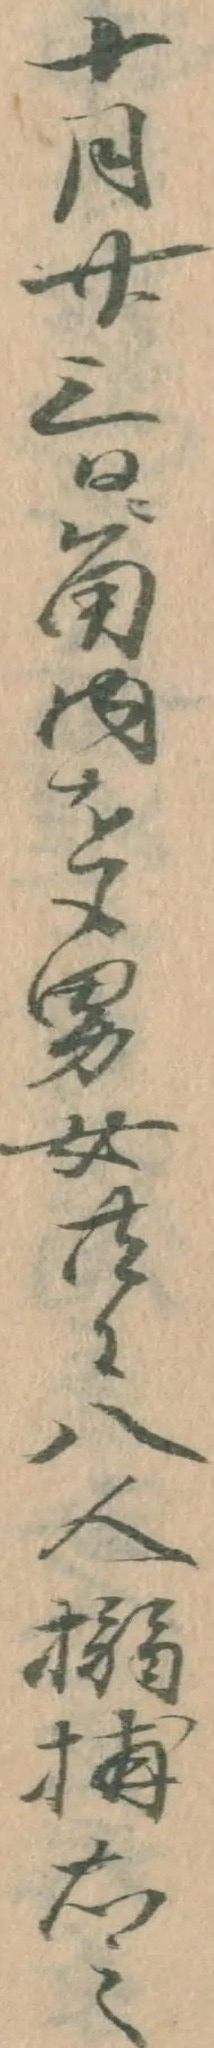十月廿三日に角内を又男女共に八人搦捕右之
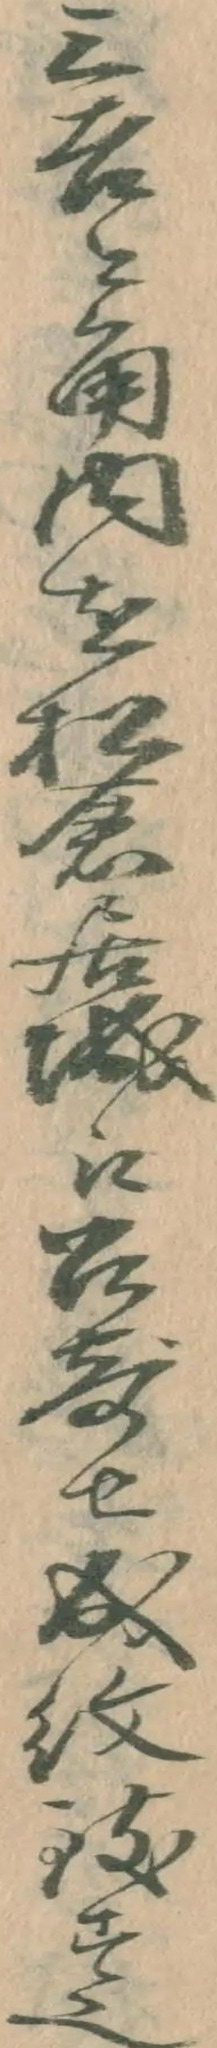三吉と角内を松倉居城え召寄せ成敗致す也

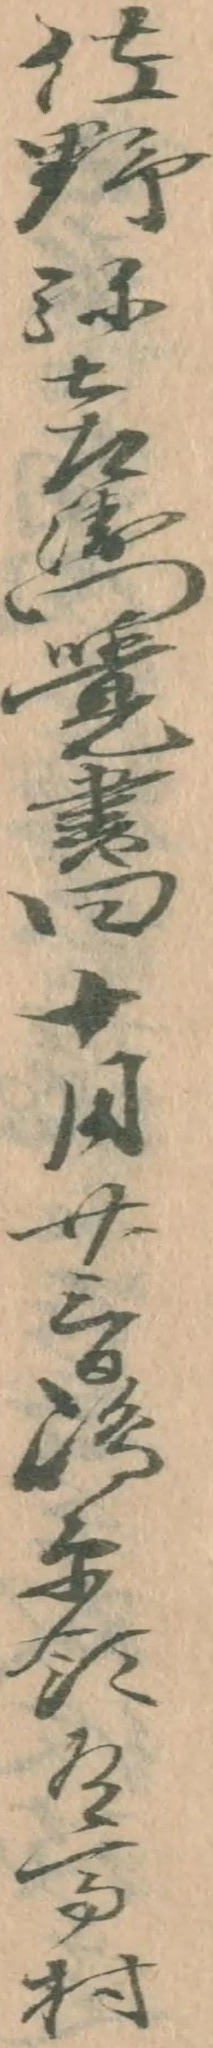佐野弥七左衛門覚書日十月廿三日島原領有馬村
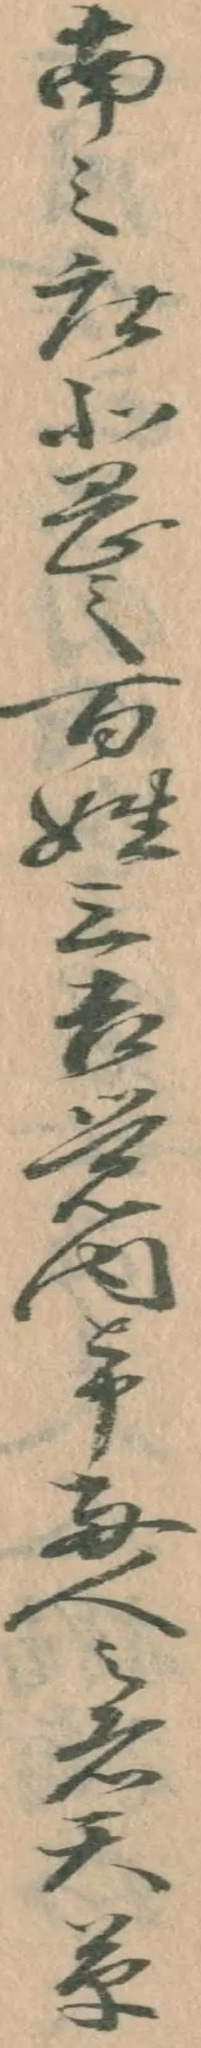南之庄北岡之百姓三吉覚内と申両人之者天草
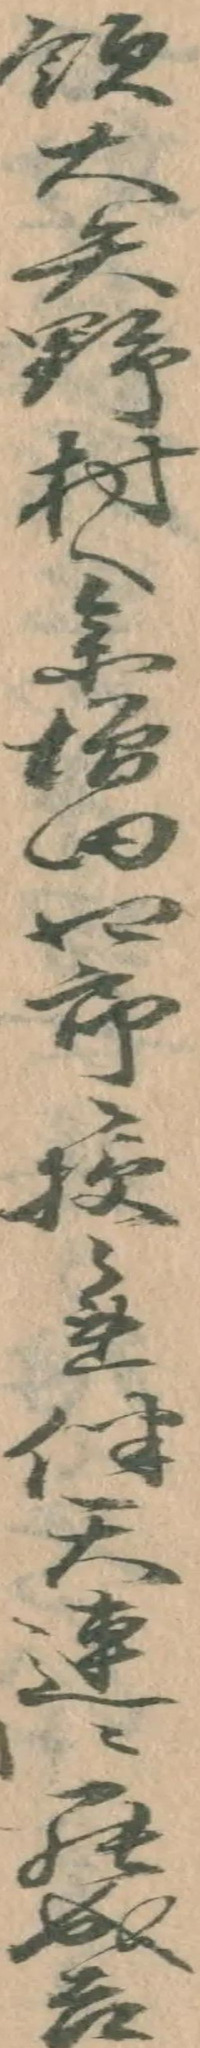領大矢野村へ参増田四郎に授られ伴天連に罷成吉
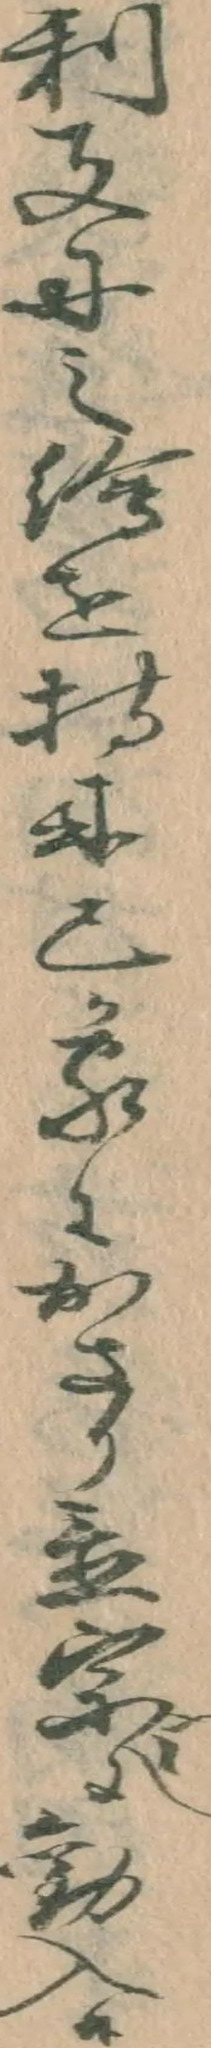利支丹之絵を持来己か家にかさり置宗門に勧入候
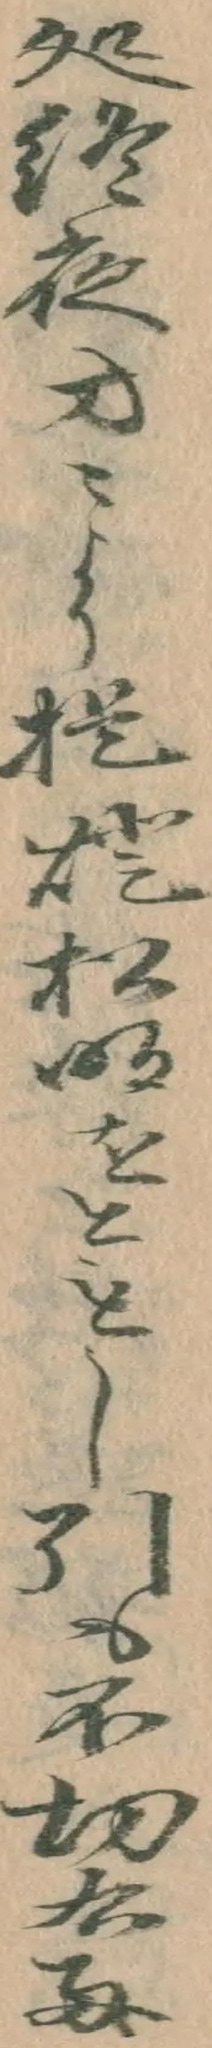処終夜方々より提灯松明をともし引も不切右両
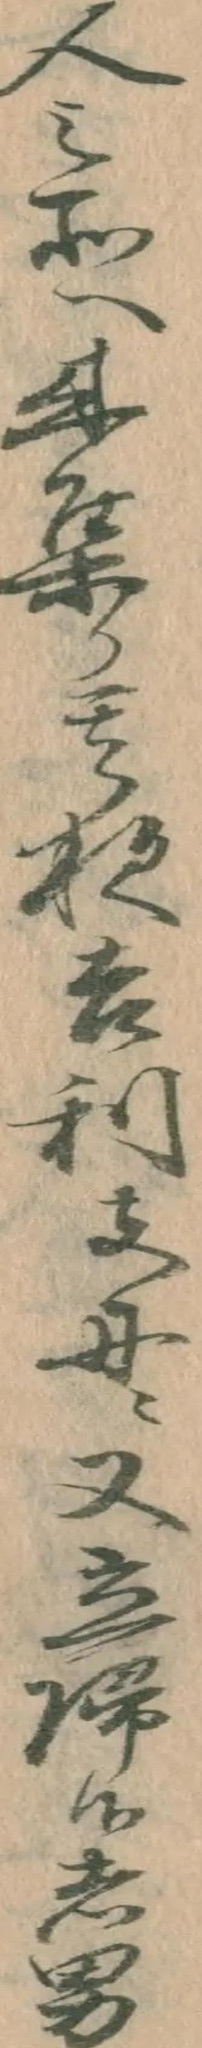人之所へ来集り其夜吉利支丹に又立帰候者男
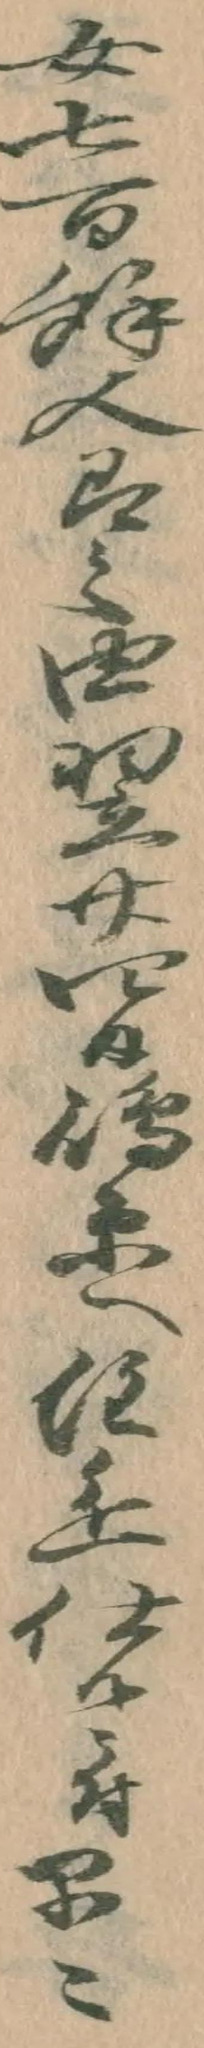女七百余人有之由翌廿四日島原へ住進仕候に付早々
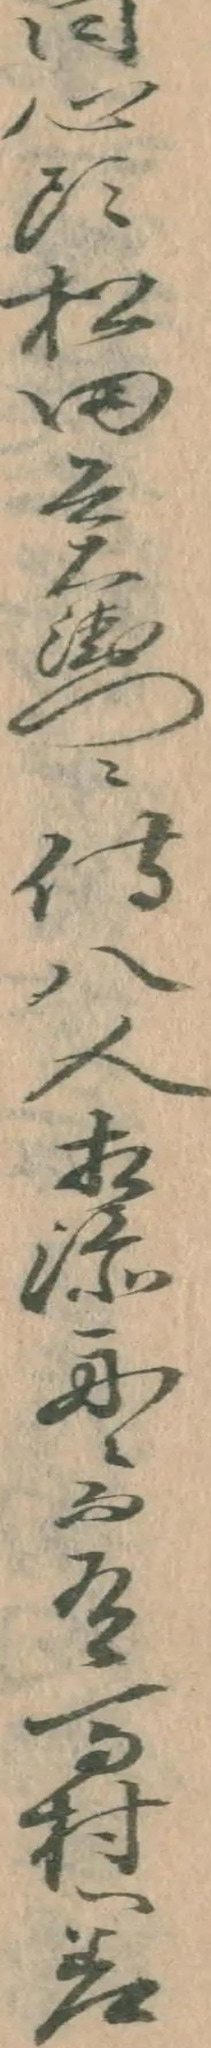同心頭松田兵右衛門に侍八人相添舟に而有馬村へ差
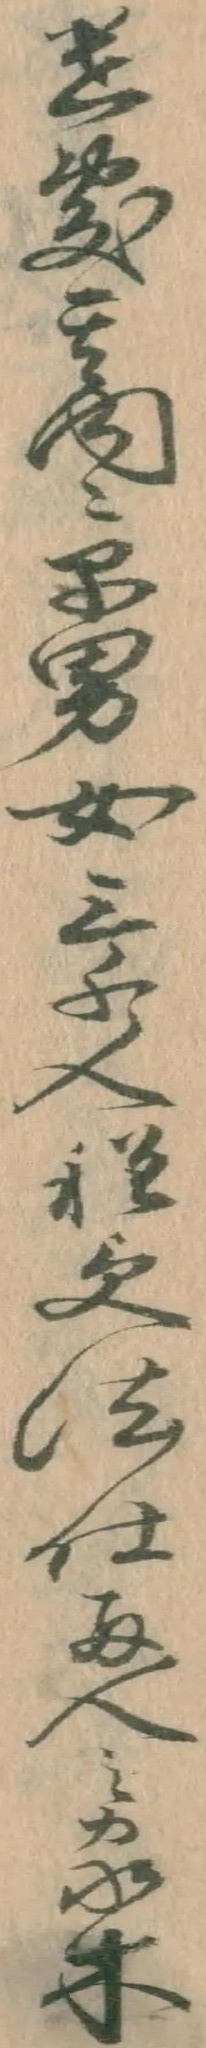遣処其内に早男女三千人程受法仕両人之家木
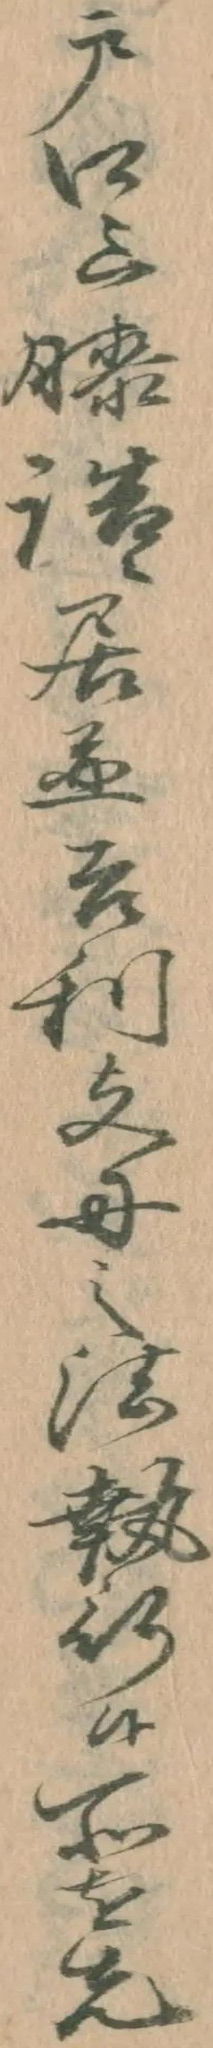戸口迄膝誥に居並吉利支丹之法執行候所を先
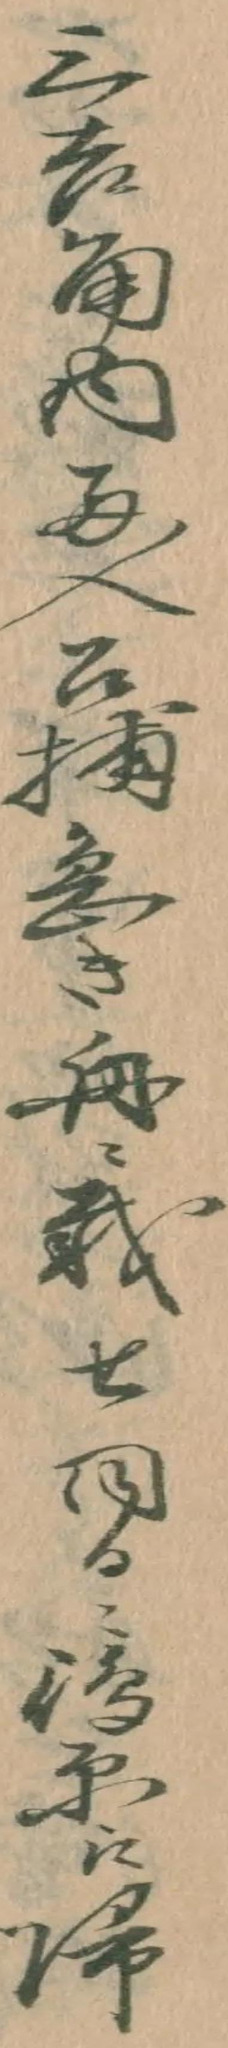三吉角内両人召捕急き舟に載せ同日に島原え帰
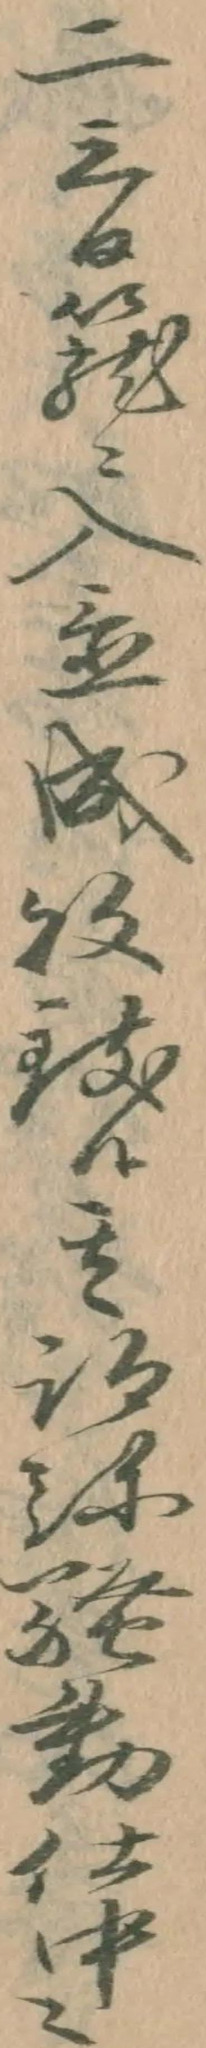二三日籠に入置成敗候其跡弥騒動仕中に
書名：切支丹御退治記 49巻. [1]
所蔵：国立国会図書館 National Diet Library, JAPAN
